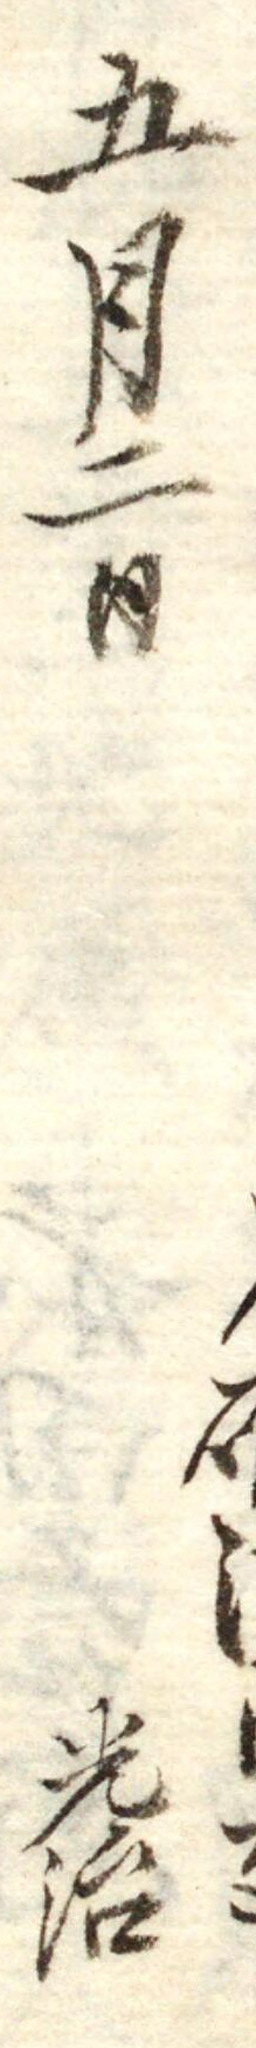五月二日光治

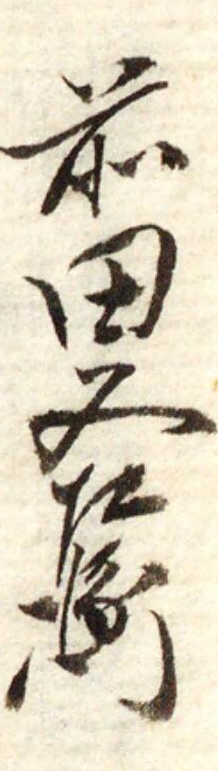前田又左衛門
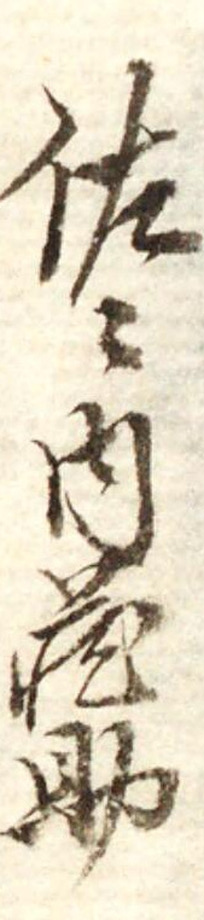佐々内蔵助
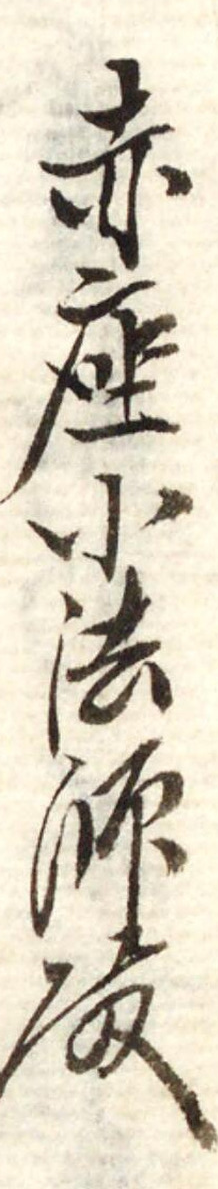赤座小法師殿
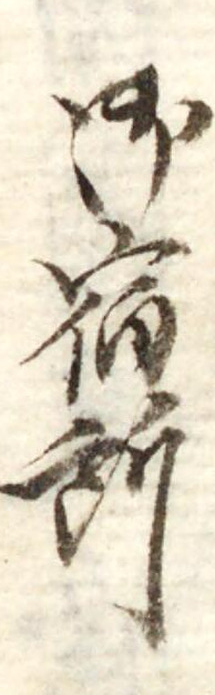御宿所
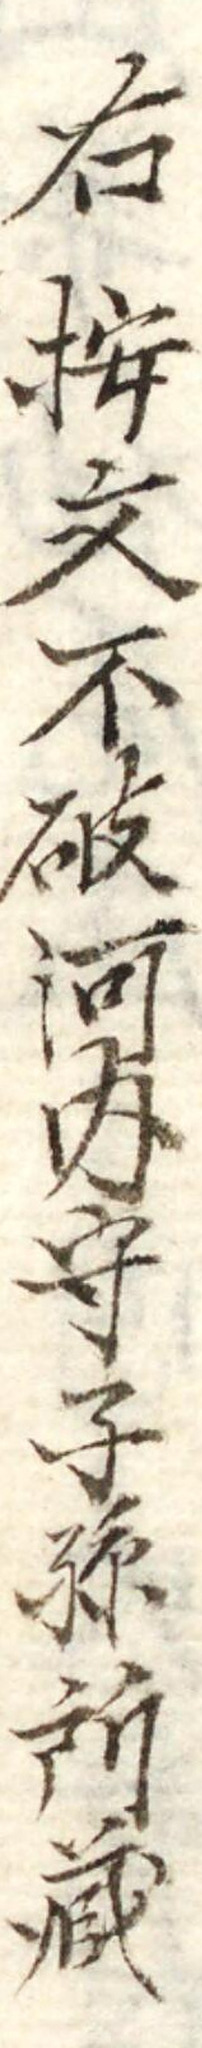右按分不破河内守子孫所蔵
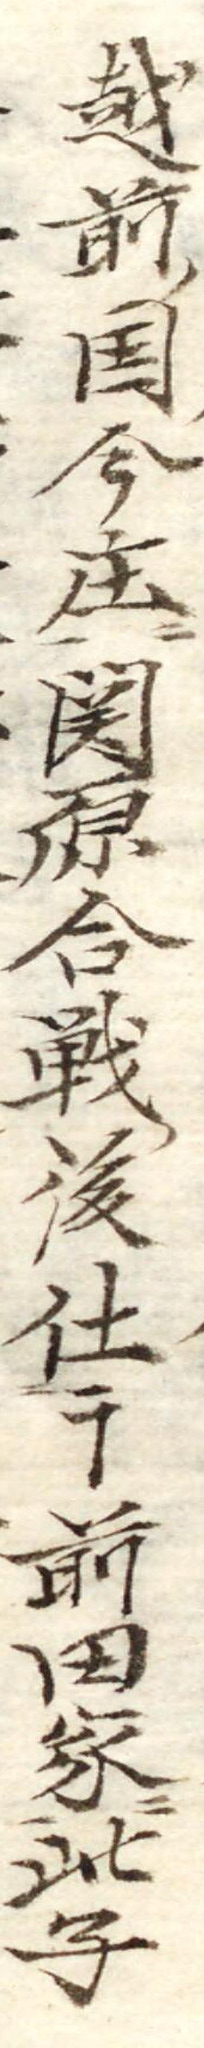越前の国今庄に関原合戦の後仕干前田家に此子
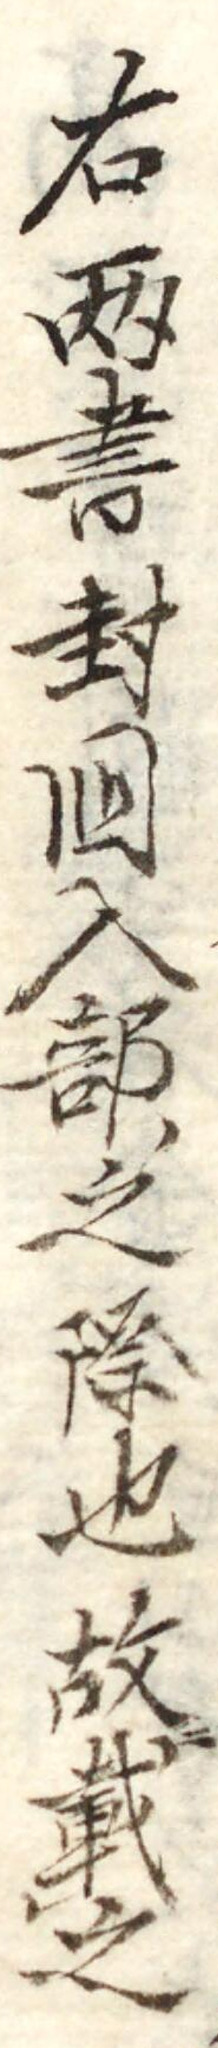右両書封国入部之際也故に載之
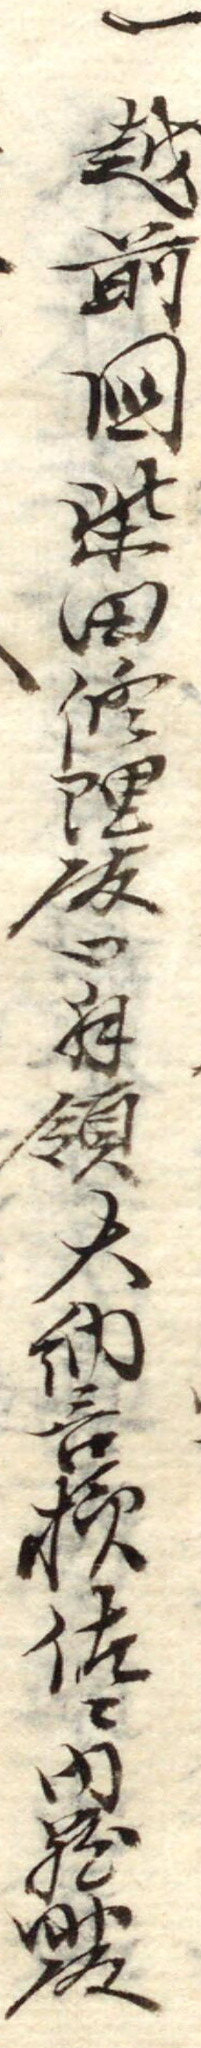一越前国柴田修理殿御拝領大納言様佐々内蔵助殿
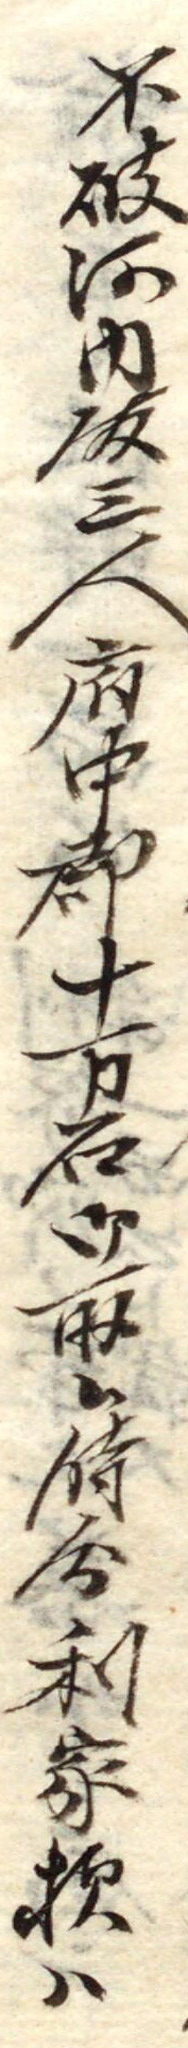不破河内殿三人府中郡十万石御所候時分利家様は
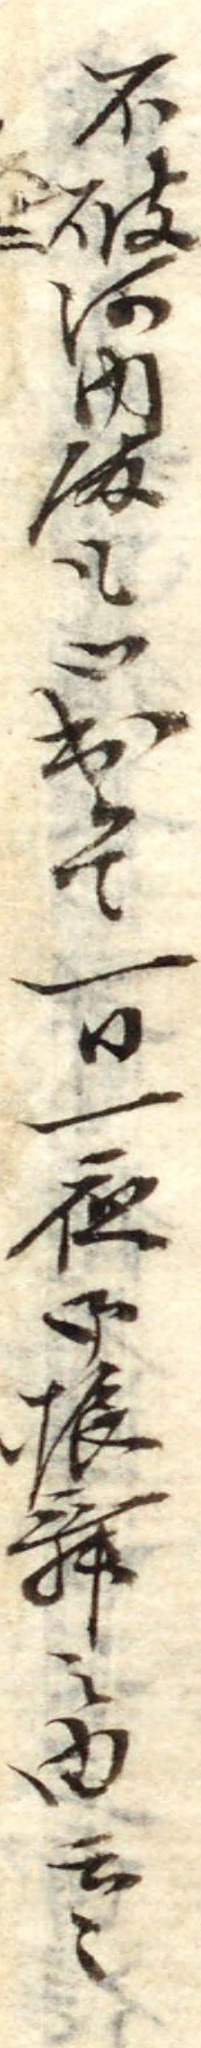不破河内殿も御出候て一日一夜御振舞之由云々
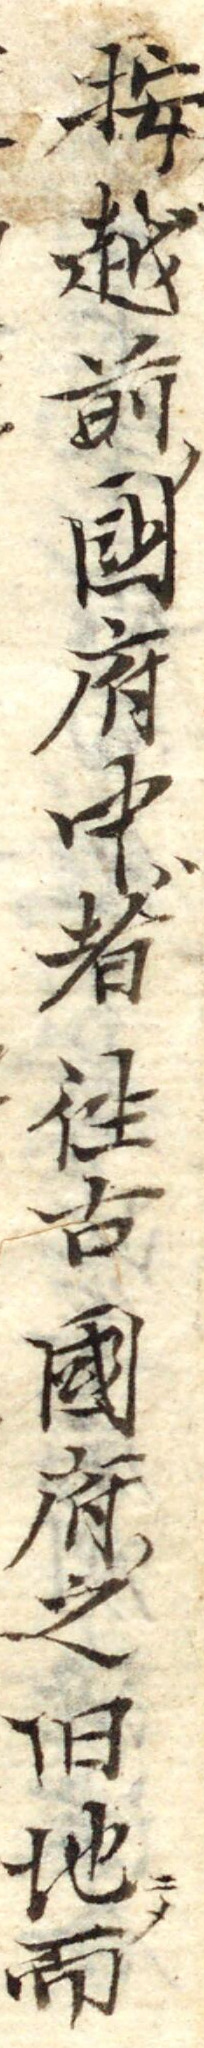按するに越前の国府中者往古国府之旧地に〆而
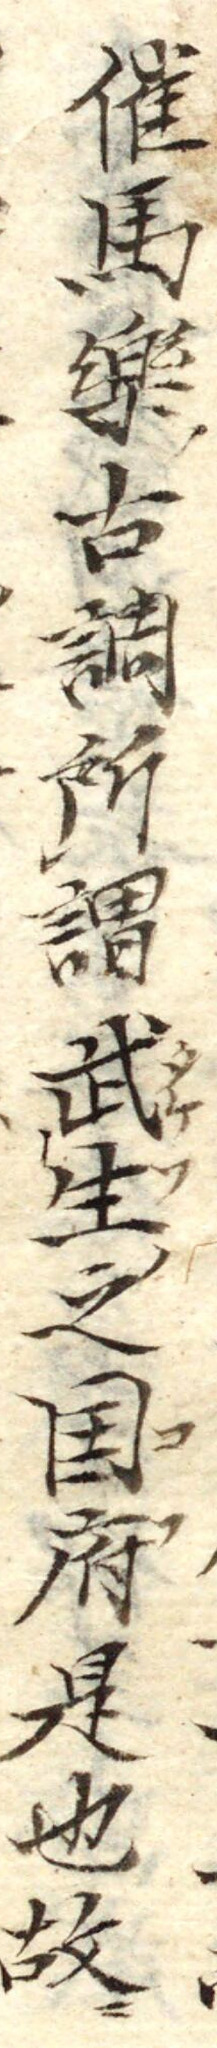催馬楽の古調所謂武生之国府是也故に
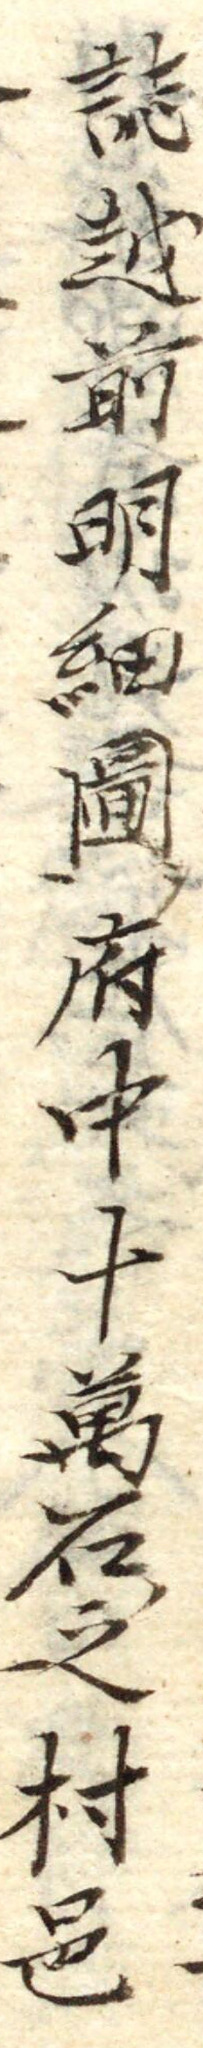誌越前明細圓を府中十万石之村邑

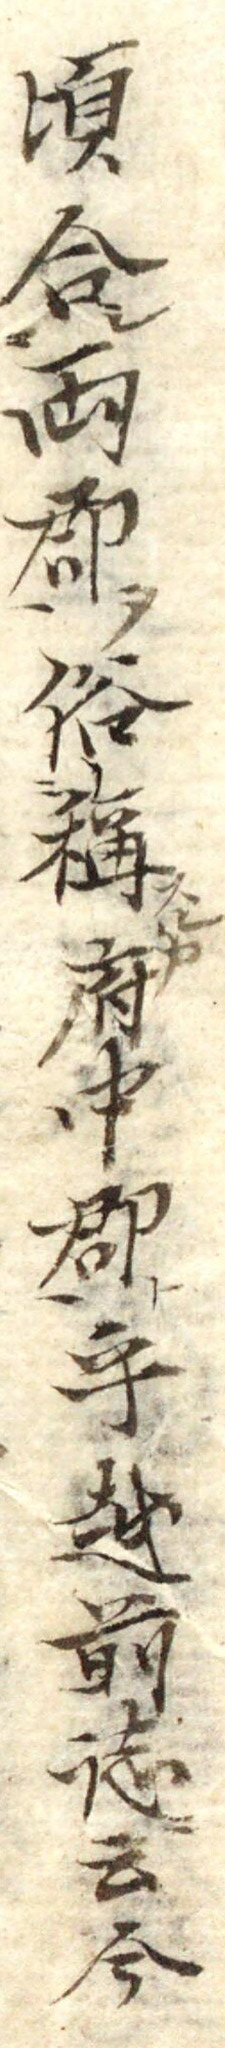頃合し両郡を俗称しか府中郡と乎越前誌に云今
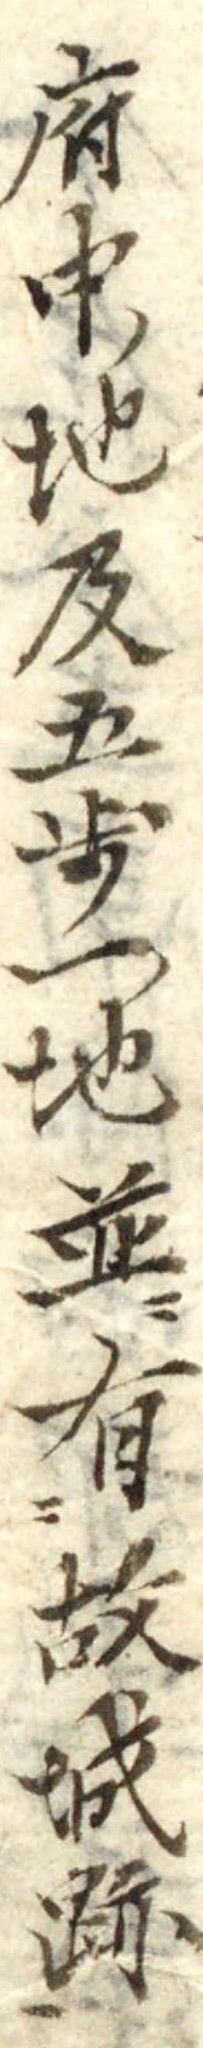府中の地及五歩一地並に有故城跡
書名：前田家封国証書集録
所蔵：Ishikawa Prefectural Library
